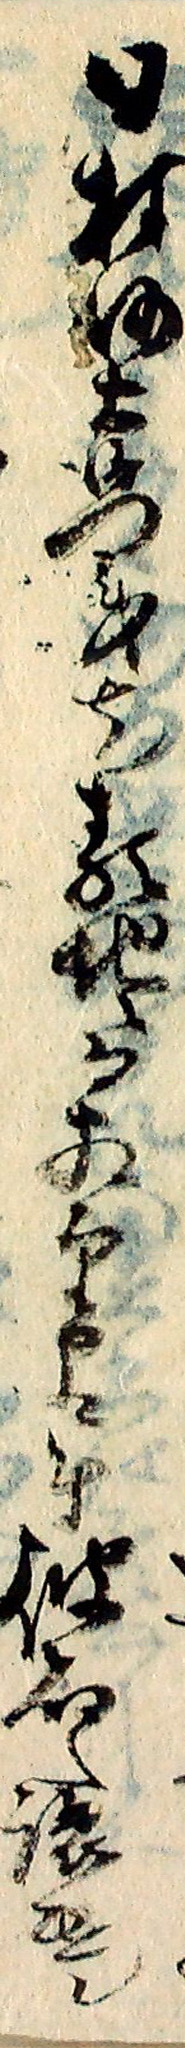同村何衛門義は類地にて相望申に付彼者へ譲遣し
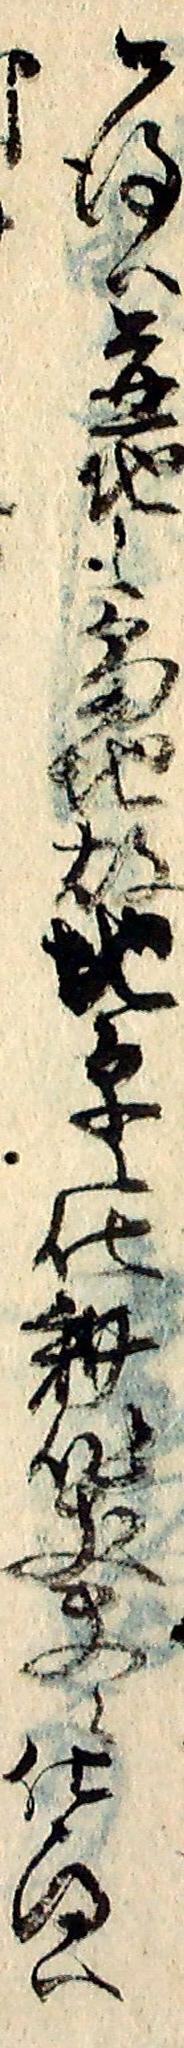候得は並地も畠地故地平に仕耕作丈夫に仕候得は
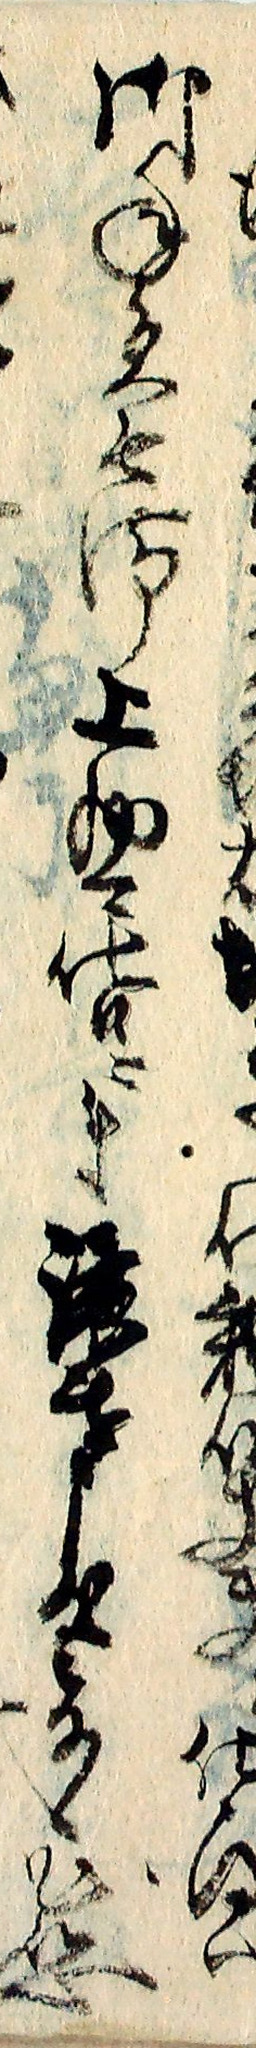御年貢無滞上納可仕候に付譲遣申度奉存候乍恐
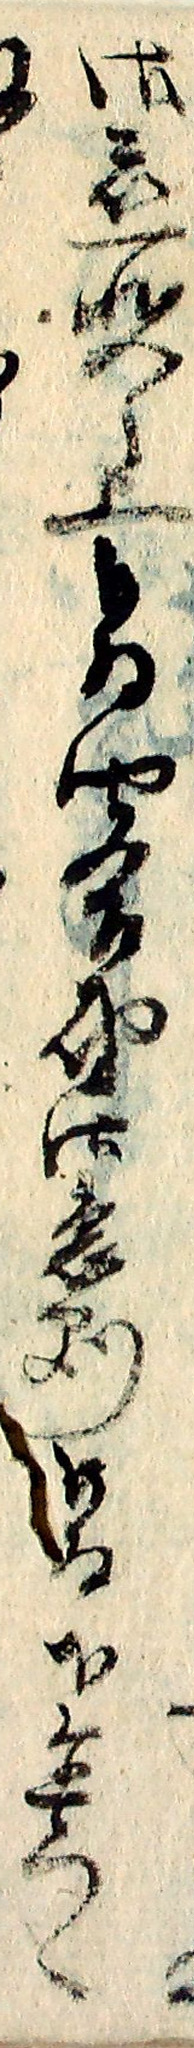御慈悲之上被為聞召届御裏判被為下置候はゝ
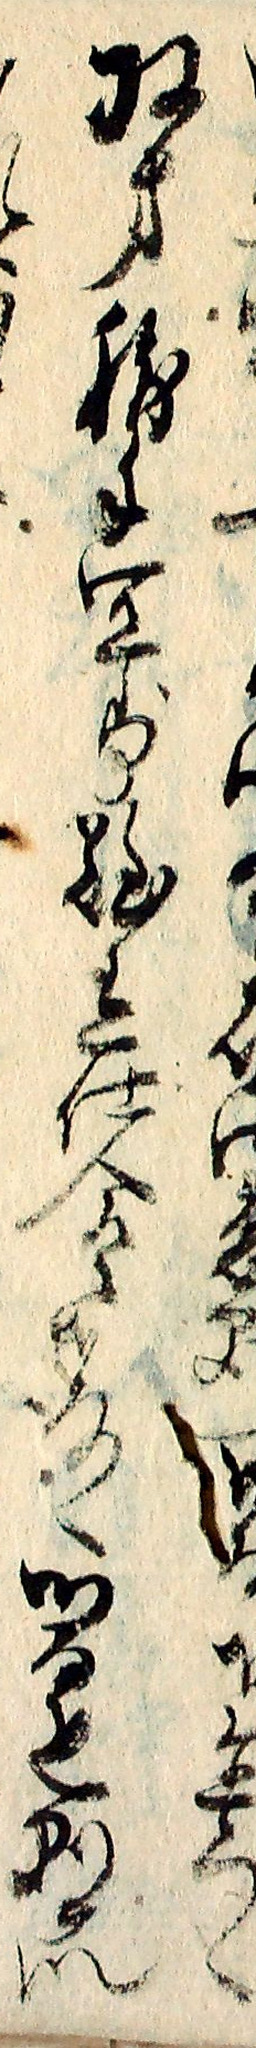双方勝手宜布難有仕合に奉存候仍て連判を以
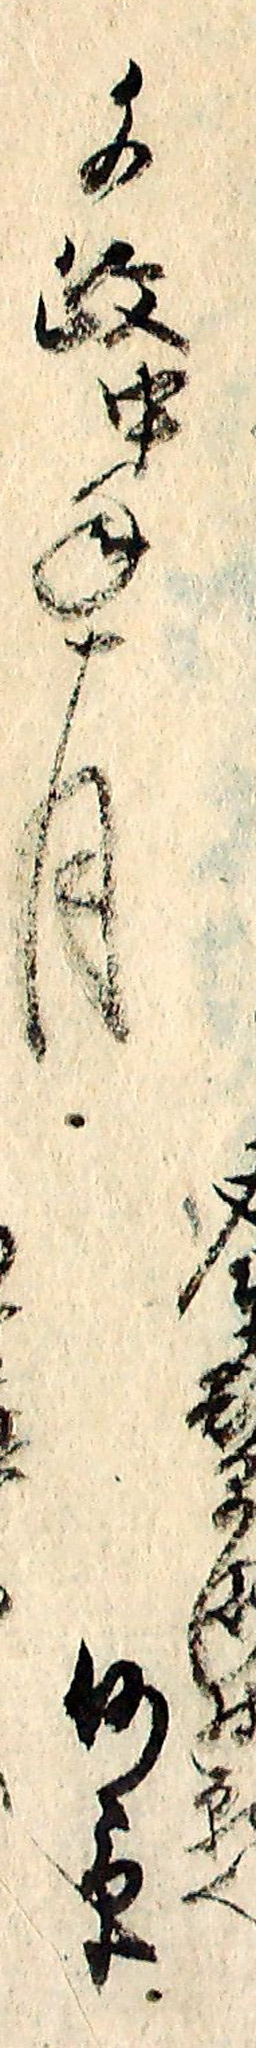文政申年十月何兵衛
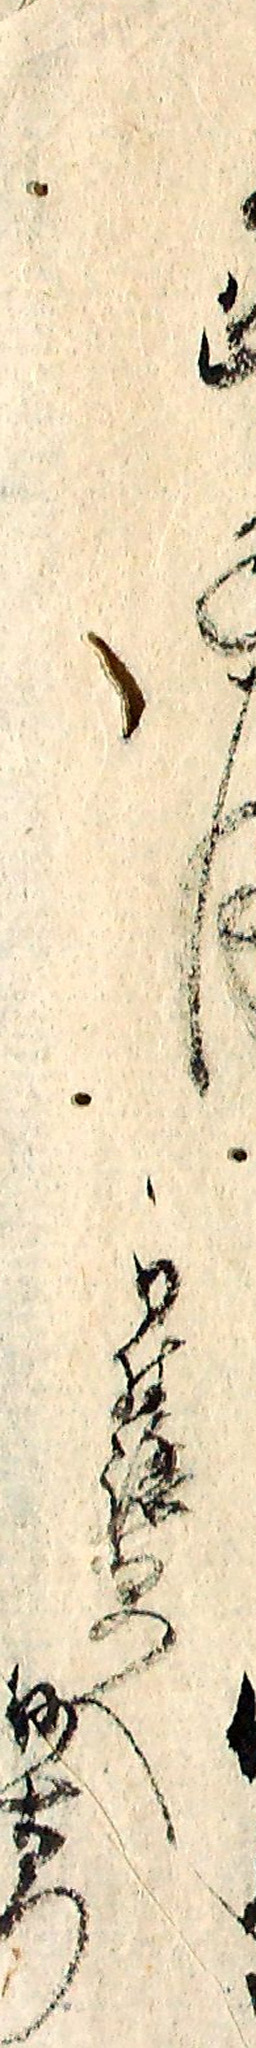同村譲受人

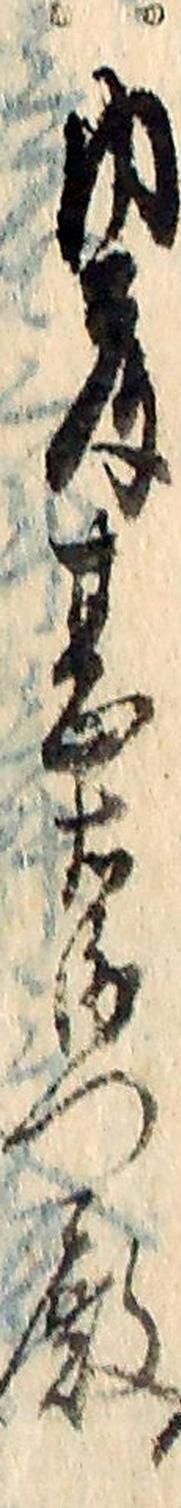内藤甚右衛門殿
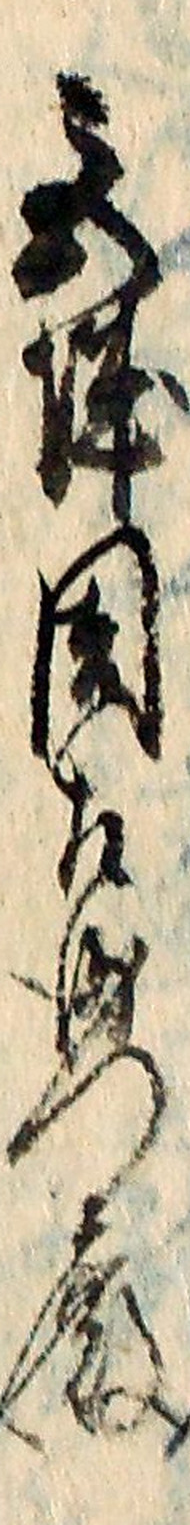宮城周左衛門殿
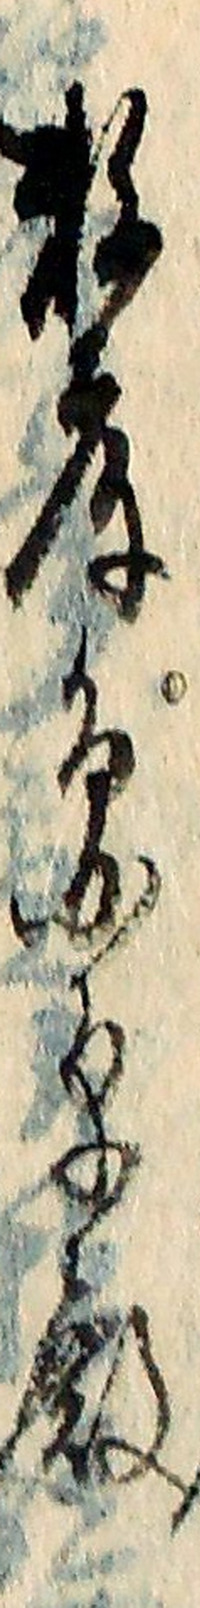数藤円平殿
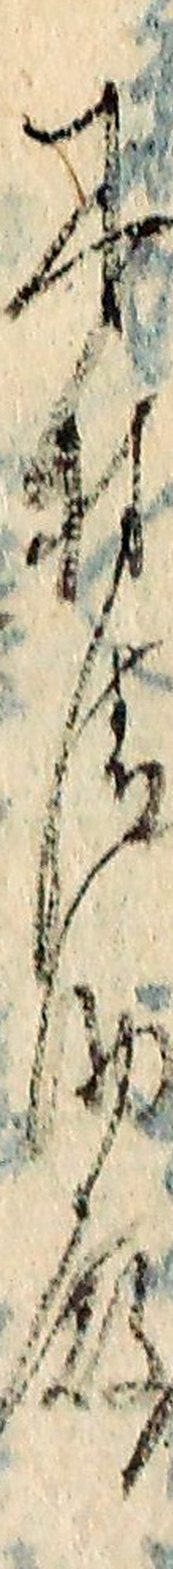木村清助殿
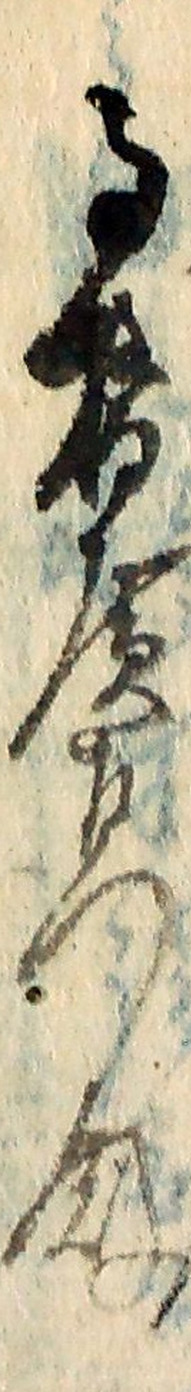高橋広左衛門殿
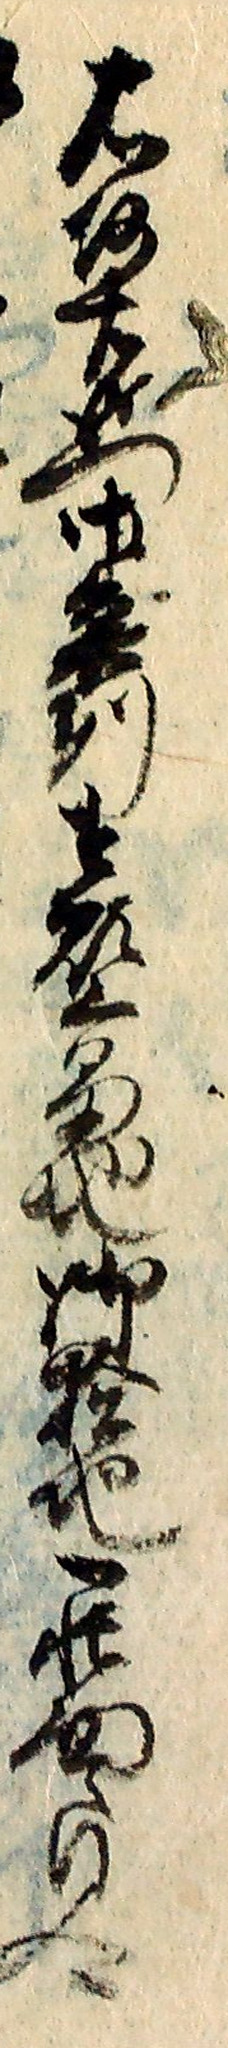右何右衛門御裏判奉願上畠地御検地御帳面に引合
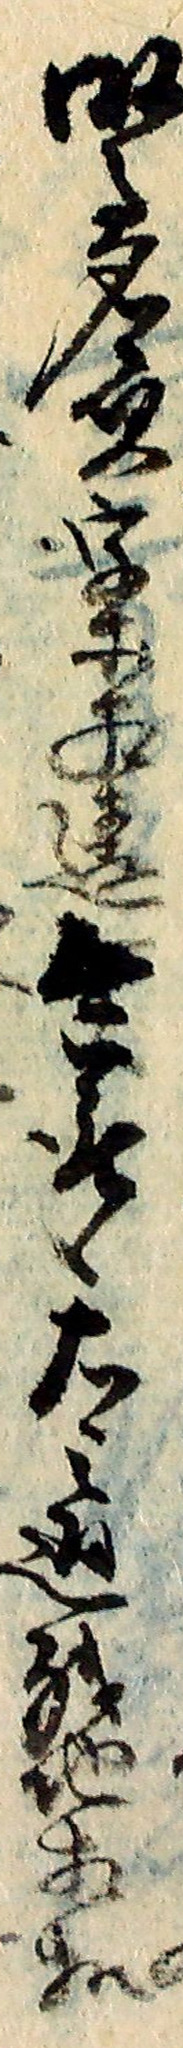畝高名負字等相違無御座候右之通残地相扣
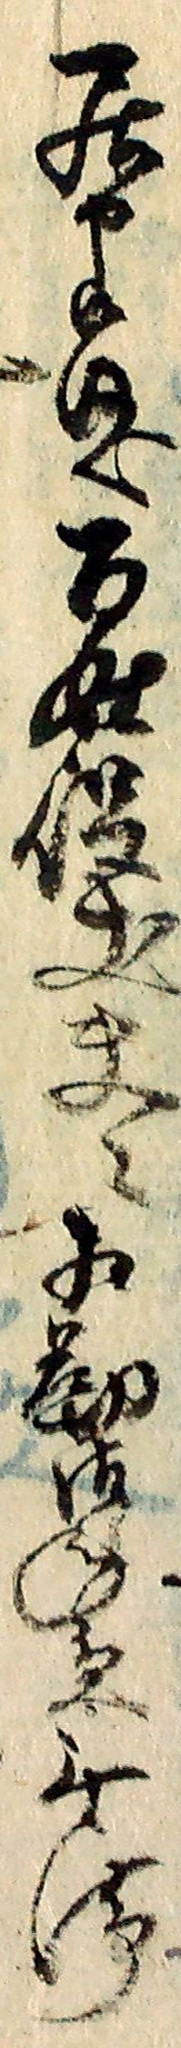居申候得は百姓役丈夫に相勤御年貢無滞
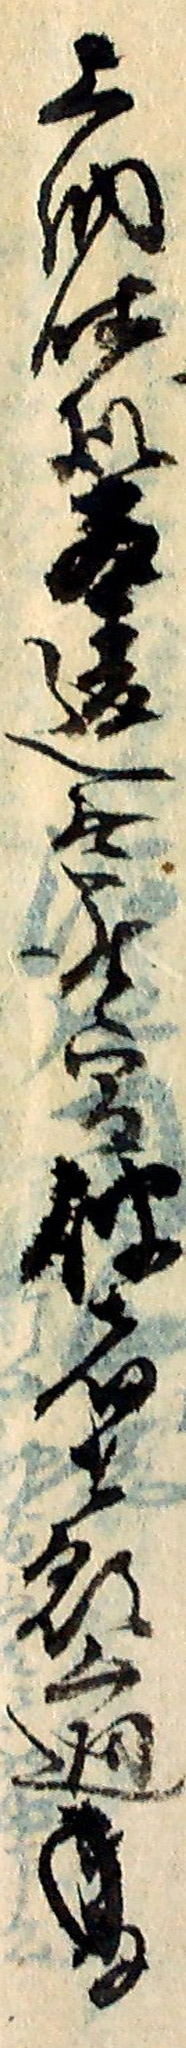上納仕処相違無御座候間彼者奉願上通「被為
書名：諸御願書控(後藤氏壱番）
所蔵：鳴門教育大学 Naruto University of Education
